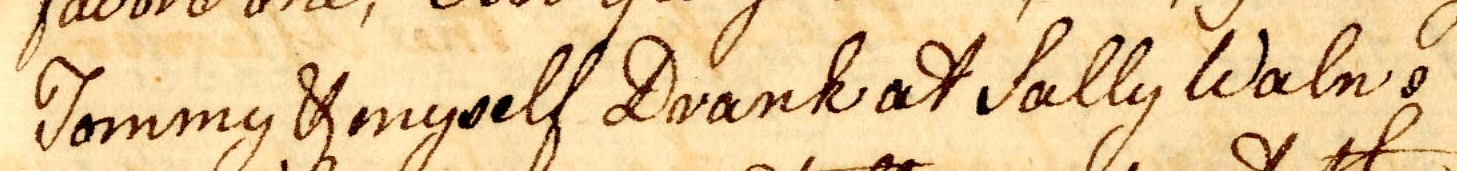Tommy & myself Drank at Sally Walns
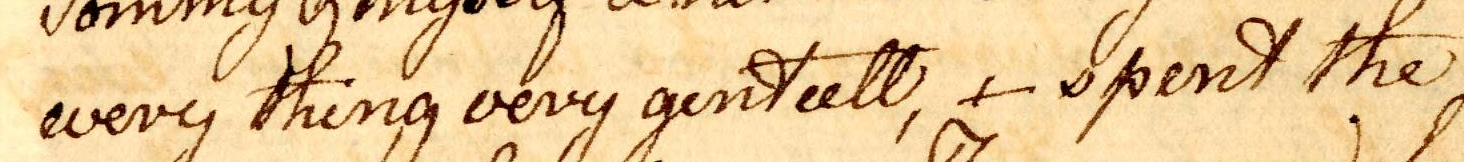every thing very genteell,- spent the
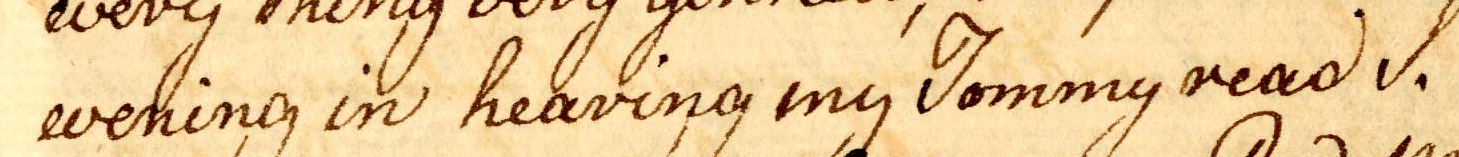evening in hearing my Tommy read S.
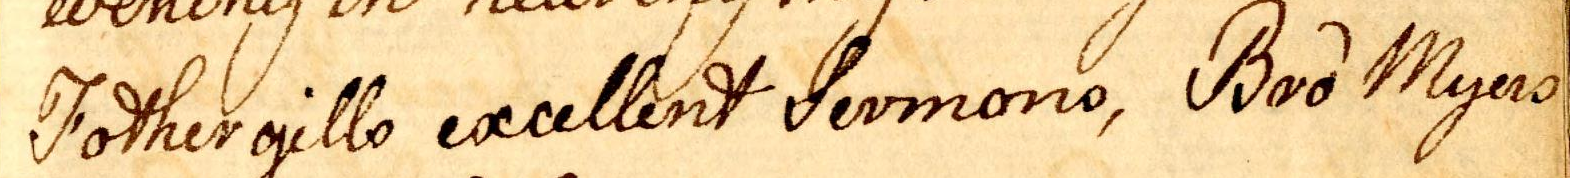Fothergills excellent Sermons, Bro' Myers
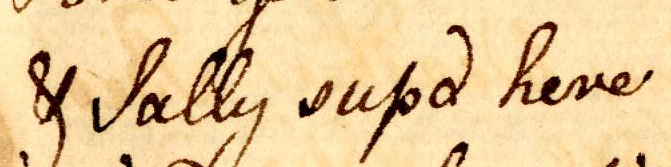& Sally supd here
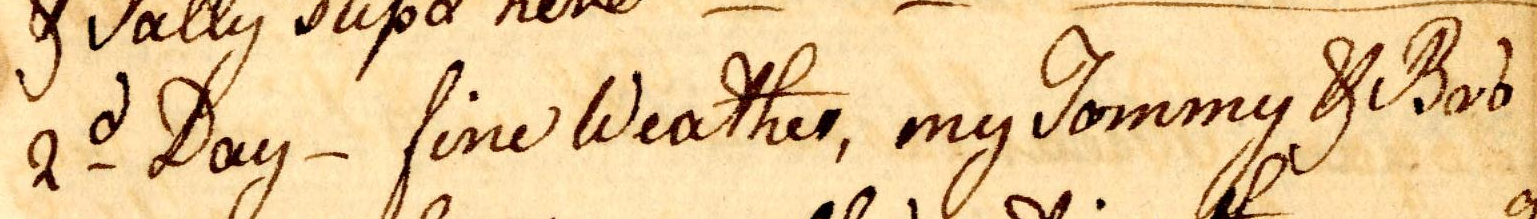2^d Day- fine Weather, my Tommy & Bro'
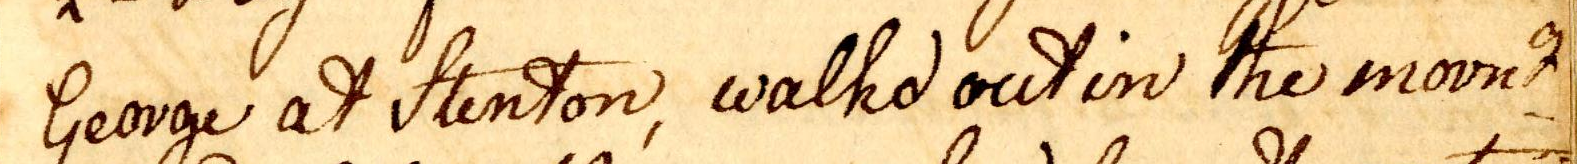George at Stenton, walkd out in the morn^g
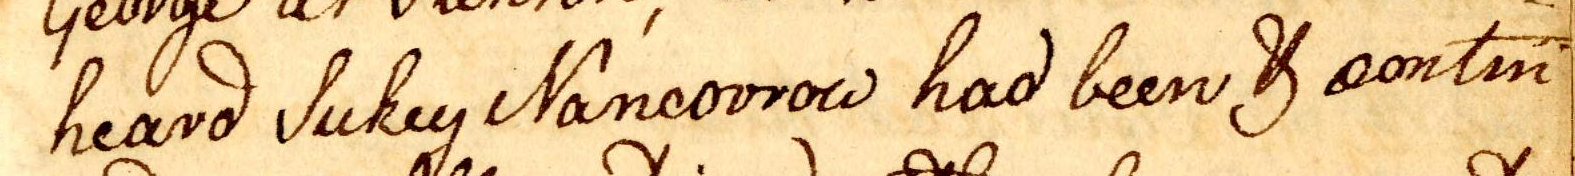heard Sukey Nancorrow had been & contin-
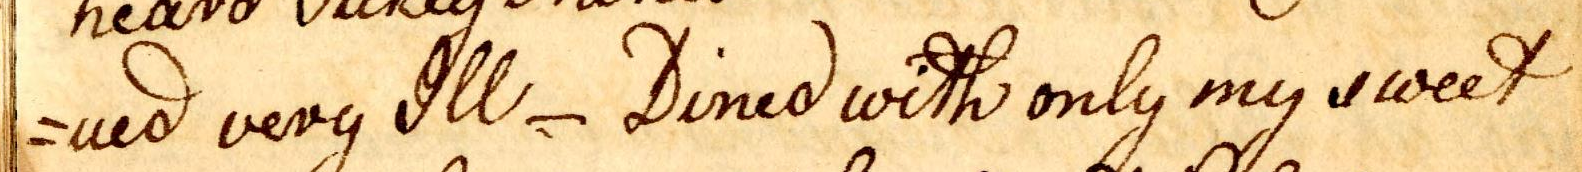-ued very Ill- Dined with only my sweet
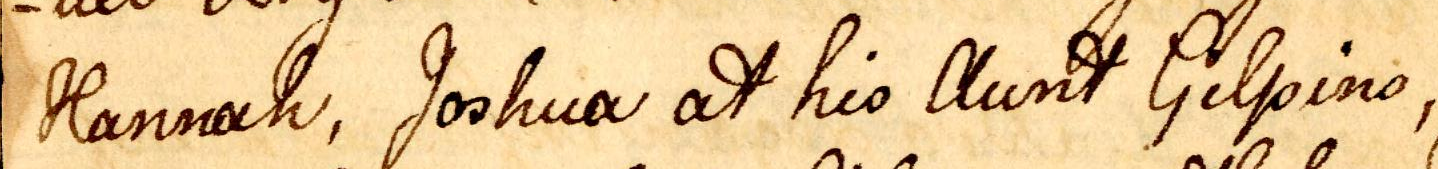Hannah, Joshua at his Aunt Gilpins,
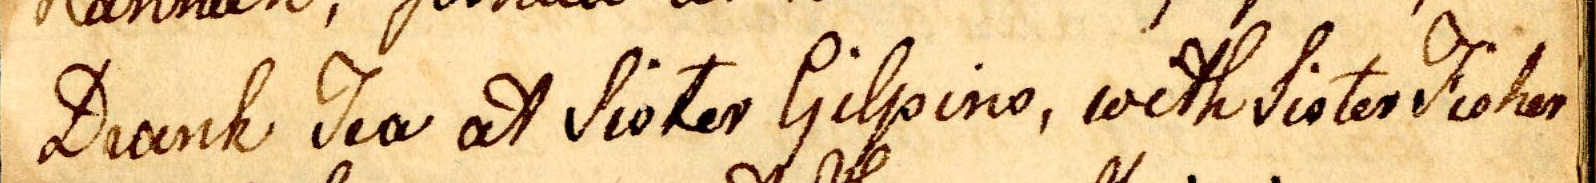Drank Tea at Sister Gilpins, with Sister Fisher
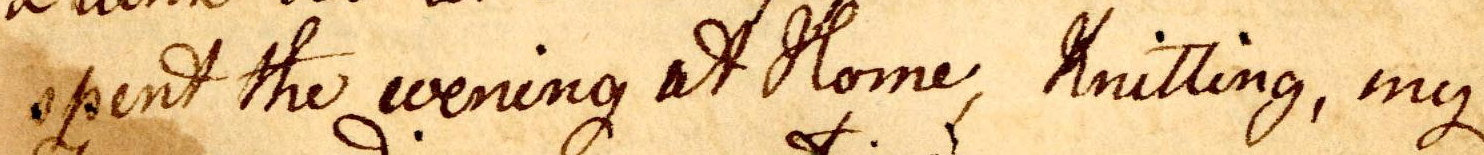spent the evening at Home, Knitting, my
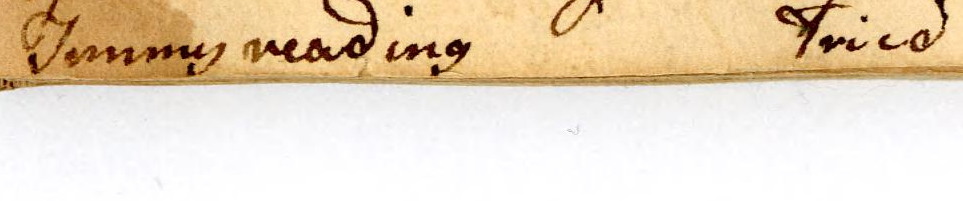Tommy reading tried
